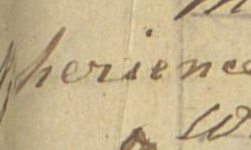-perience
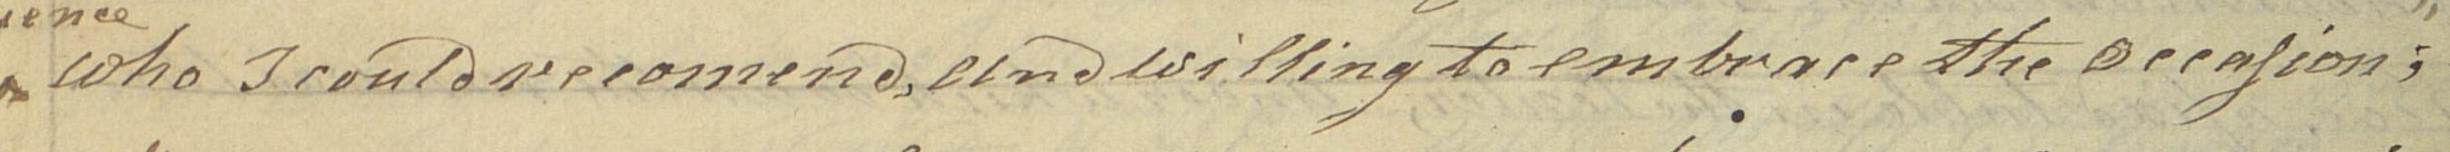^ who I could recomend, and willing to embrace the Occasion;"
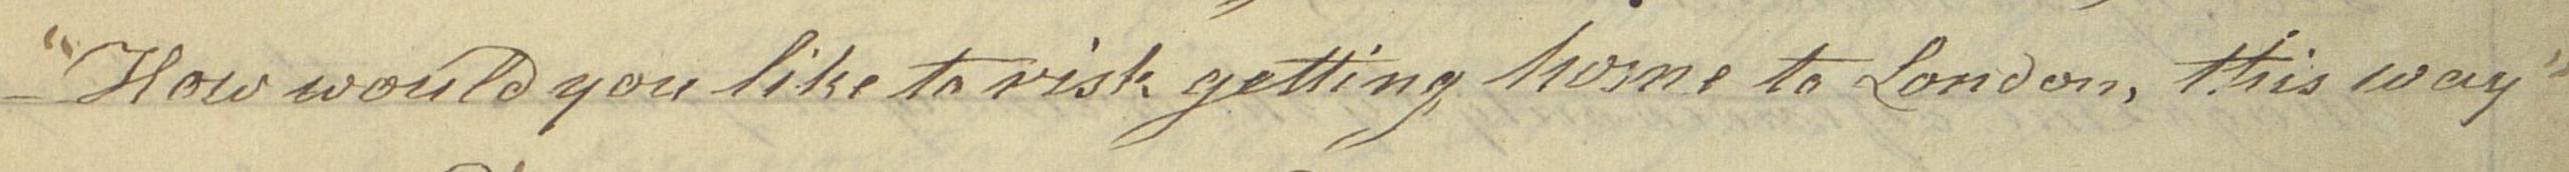"How would you like to risk getting home to London, this way"
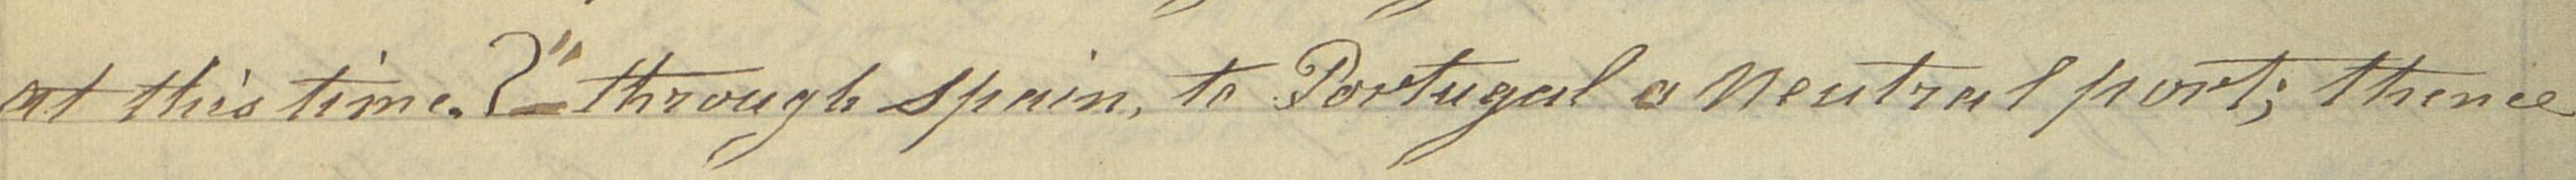at this time?" through spain to Portugal a neutral port; thence
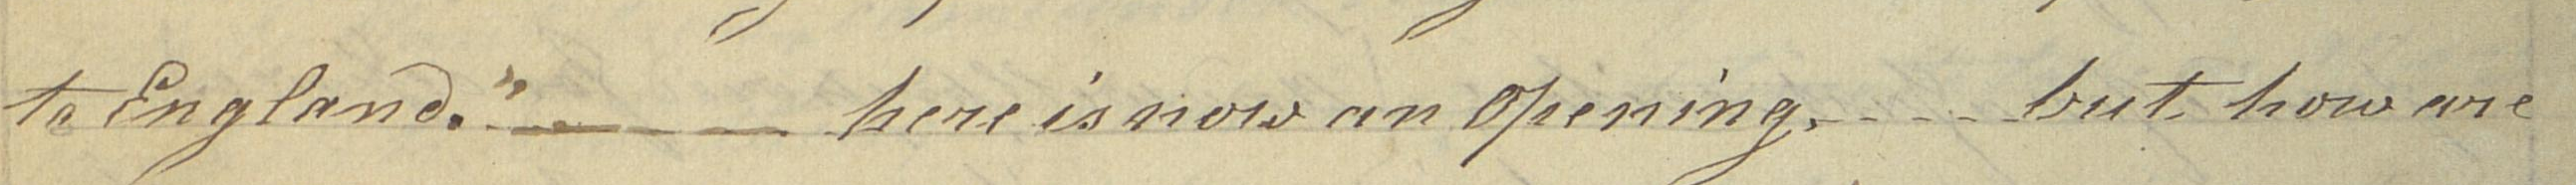to England." here is now an Opening, but how are
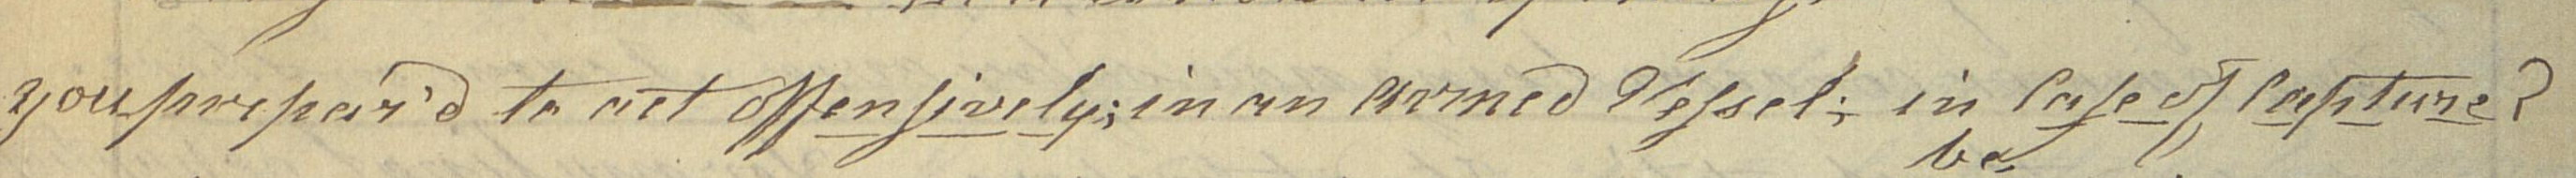you prepar'd to act offensively; in an armed Vessel: in Case of Capture?
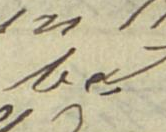be,
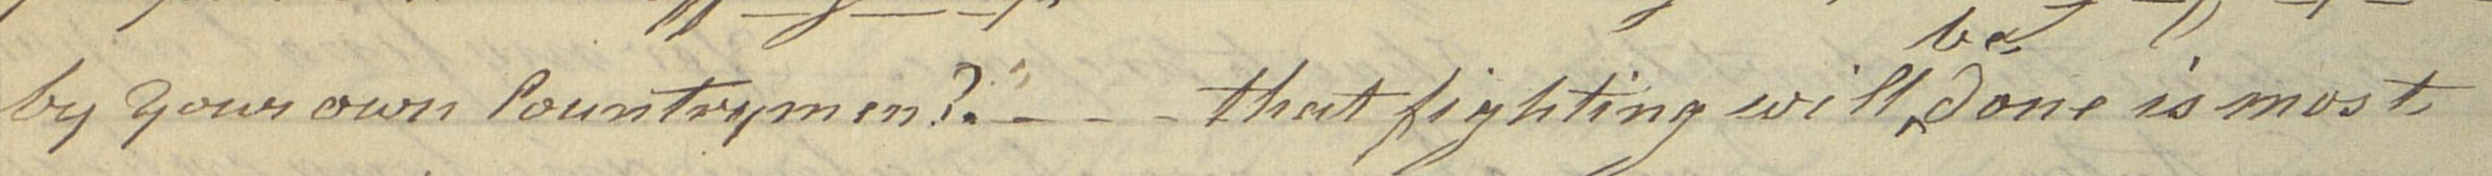by Your own Countrymen? That fighting will ^ done is most
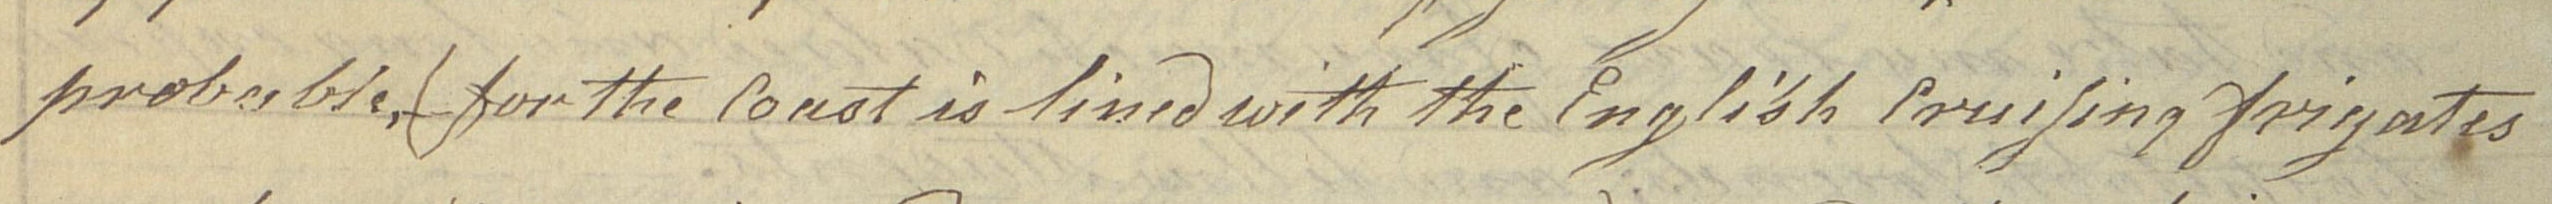probably for the Coast is lived with the English Cruising frigates
